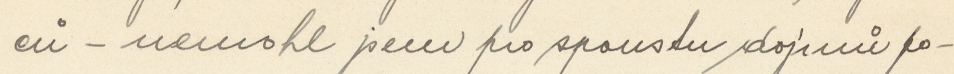ců - nemohl jsem pro spoustu dojmů po-
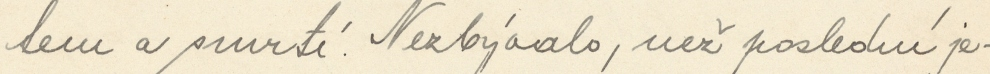tem a smrtí. Nezbývalo, než poslední je-
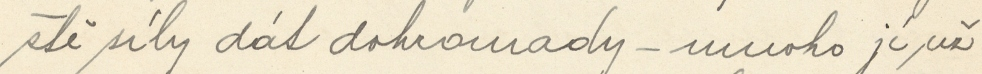ště síly dát dohromady - mnoho jí už
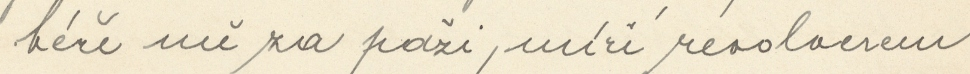béře mě za paži, míři revolverem
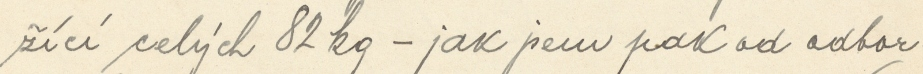žící celých 82 kg - jak jsem pak od odbor-
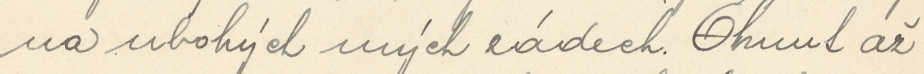na ubohých mých zádech. Ohnut až
